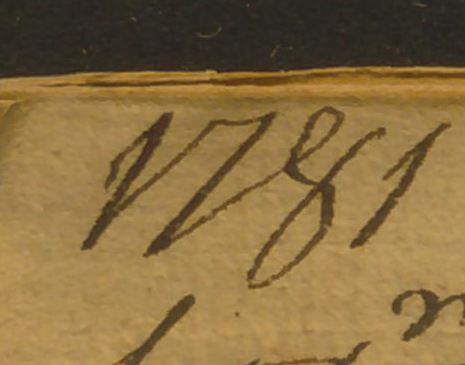1781
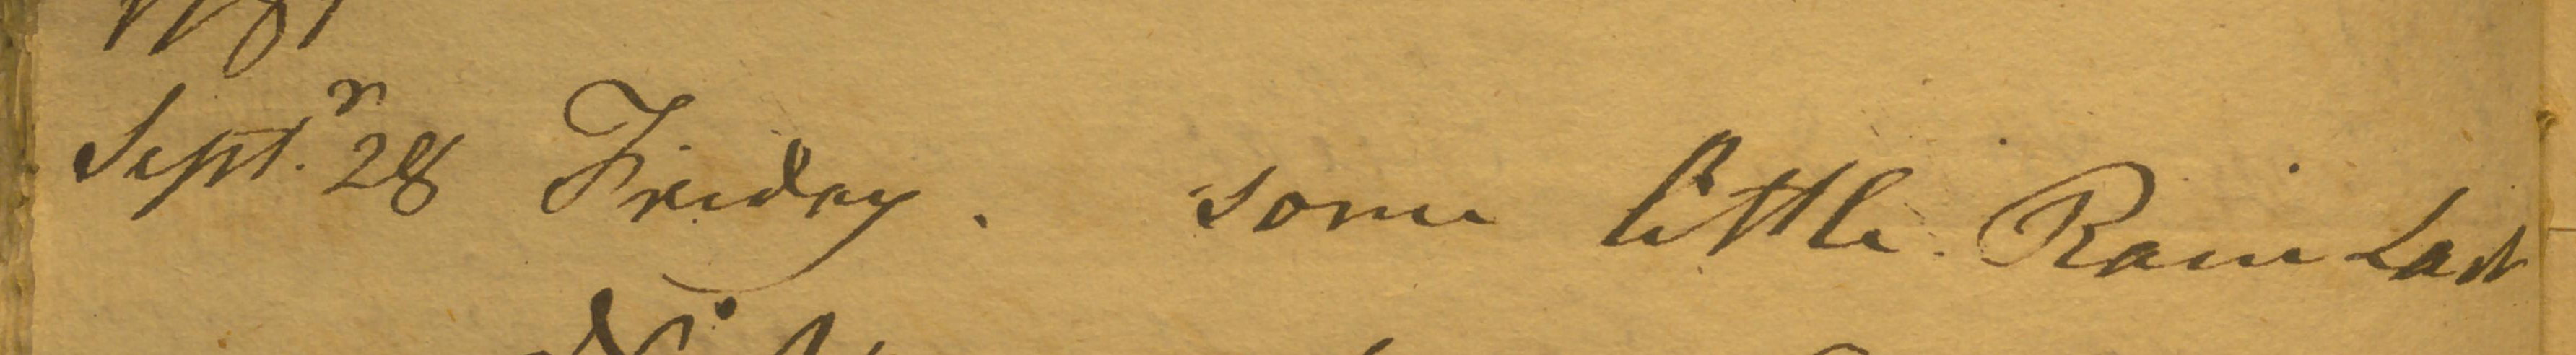Sept^r. 28 Friday. some little Rain Last
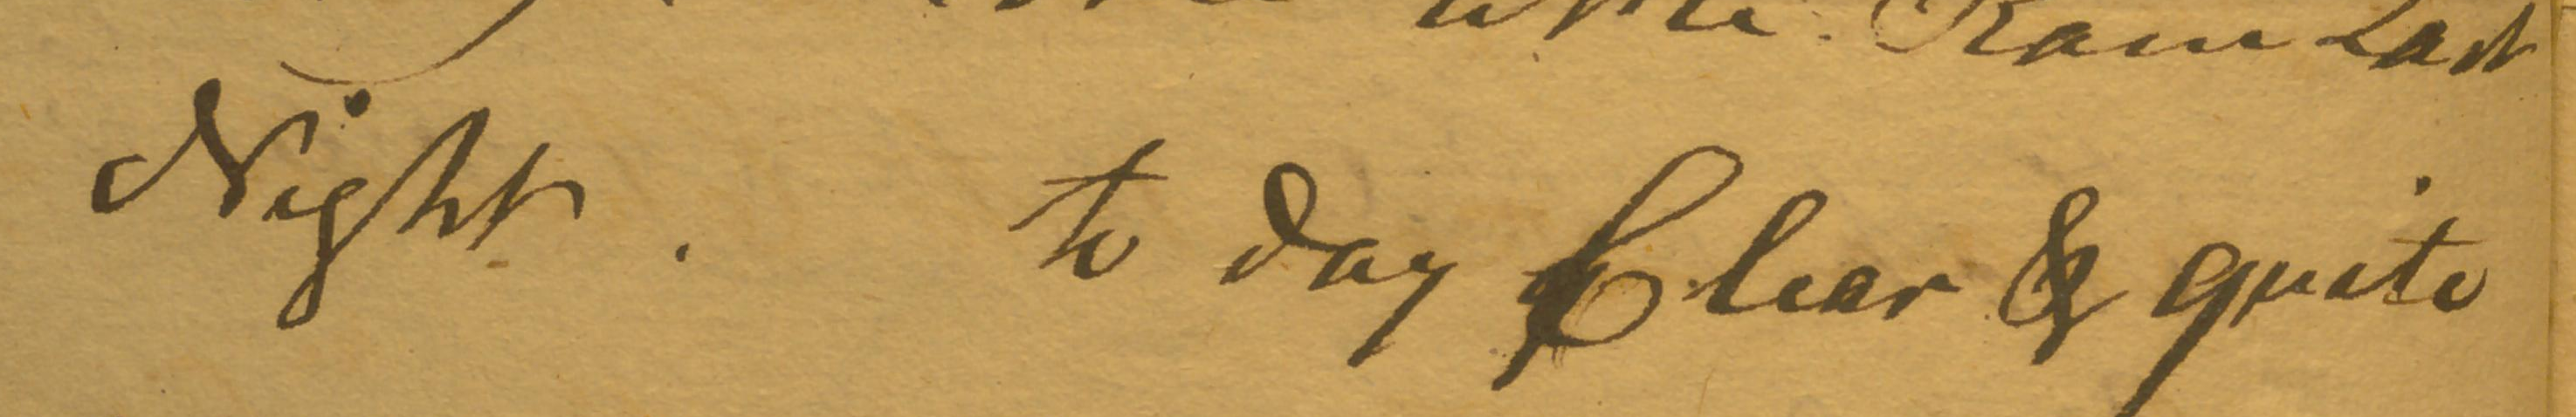Night, to day Clear & quite
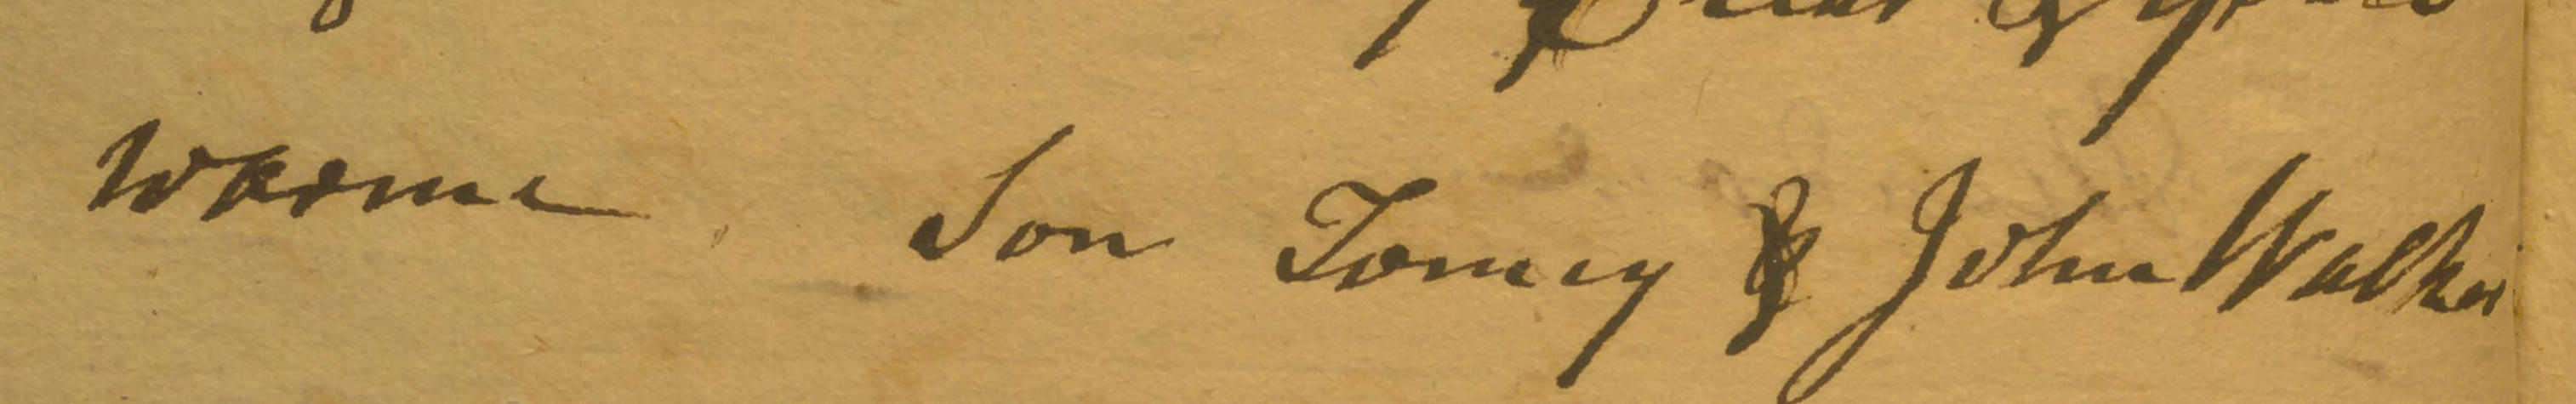warme. Son Tomey & John Walker
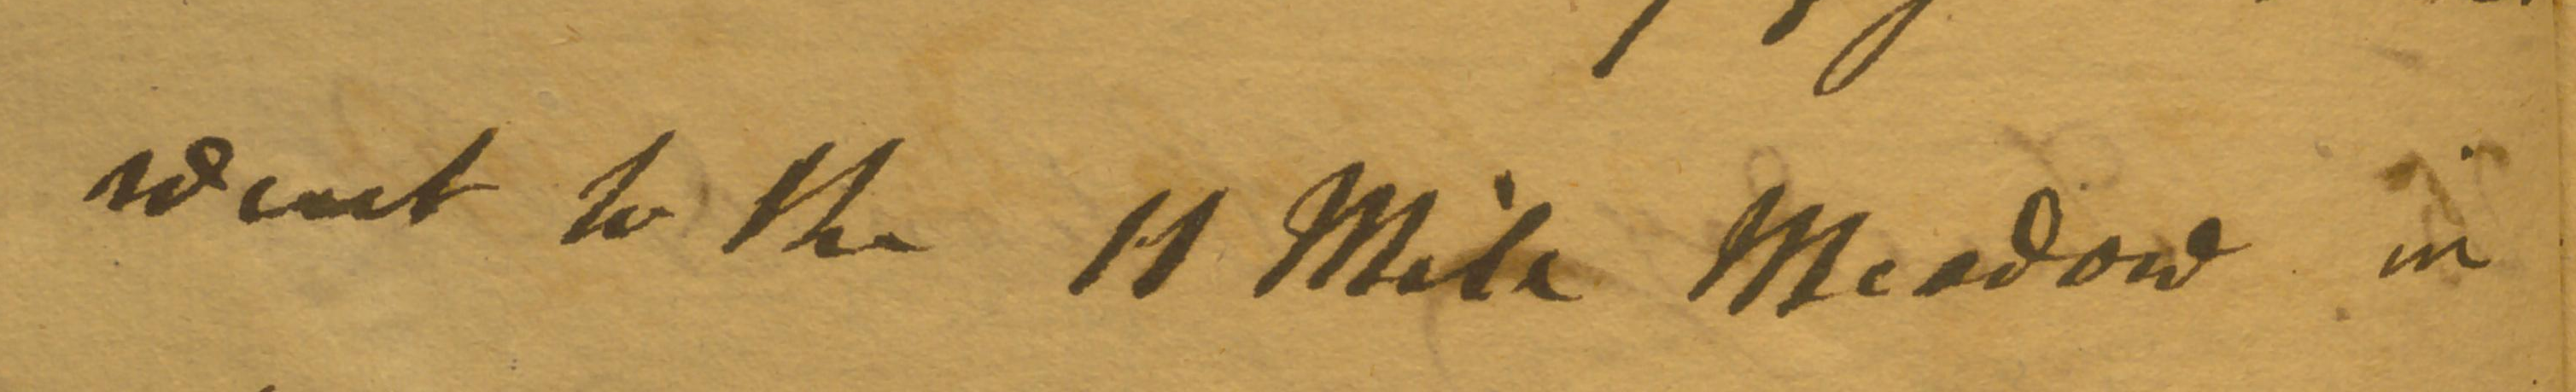went to the 11 Mile Meadow in
